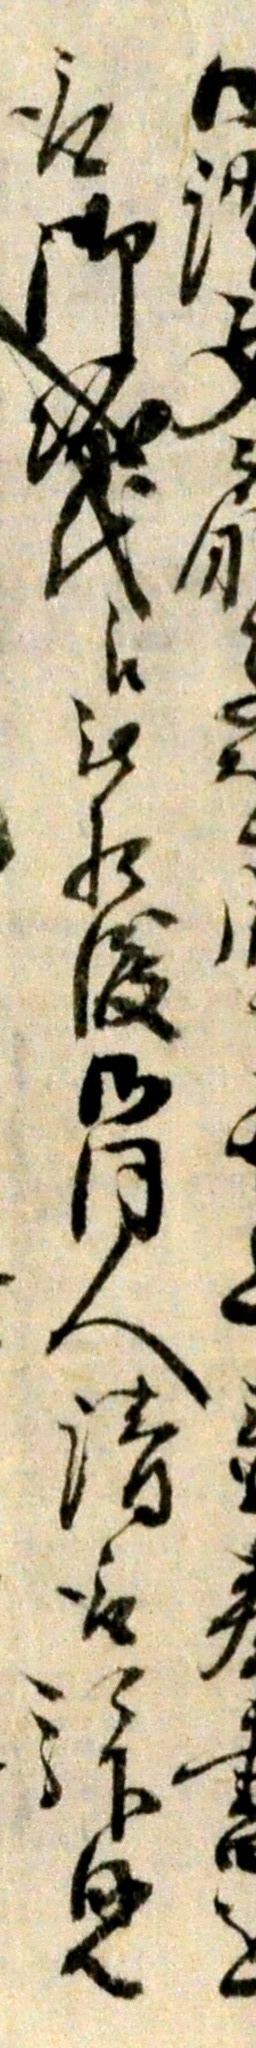取御城代江被相渡御同人請取拝見
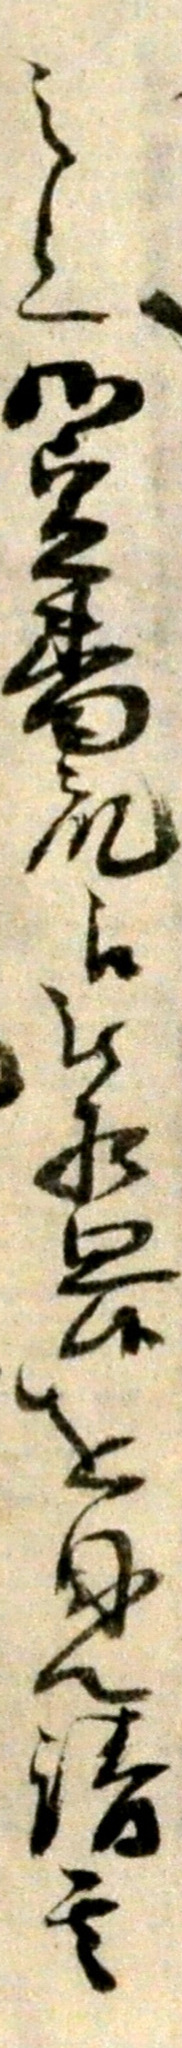之上御定番衆江被相廻候を見請其
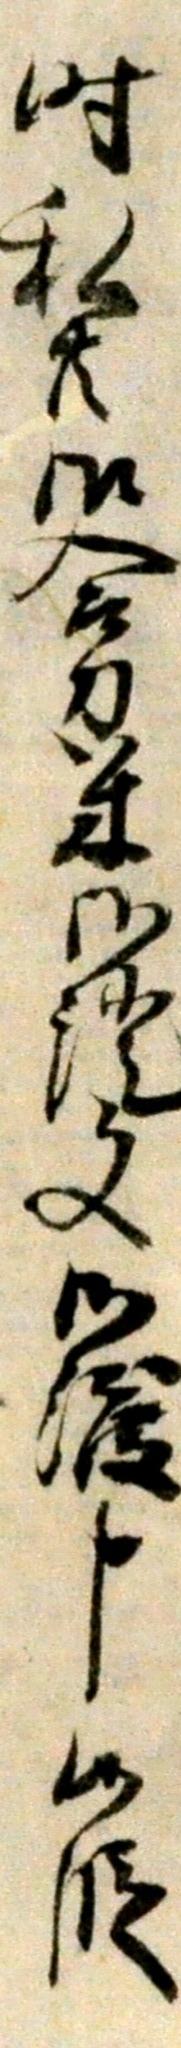時私共御合力米御證文御渡申候段
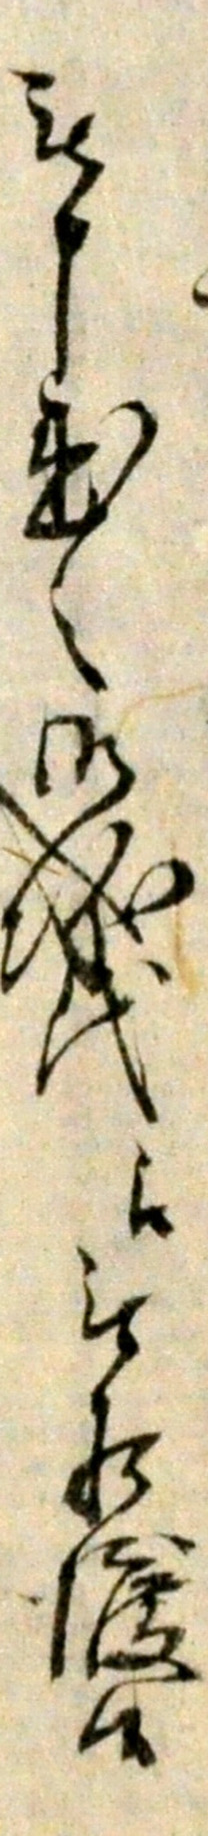被申出之御城代江被相渡候
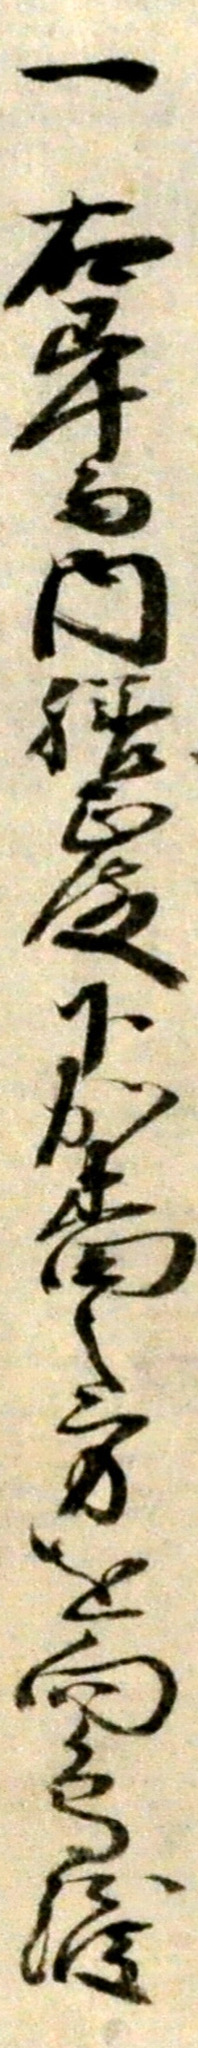一右卆而内膳正殿下加番之方を向鳥渡
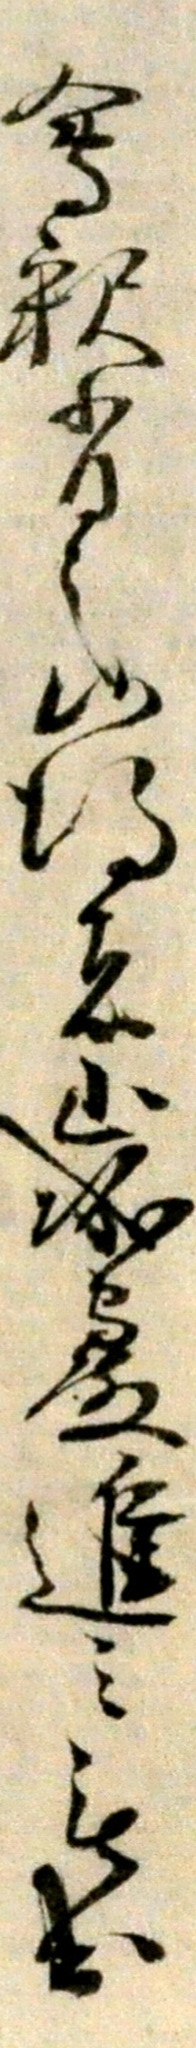会釈有之候得者山城守殿進ミ被出
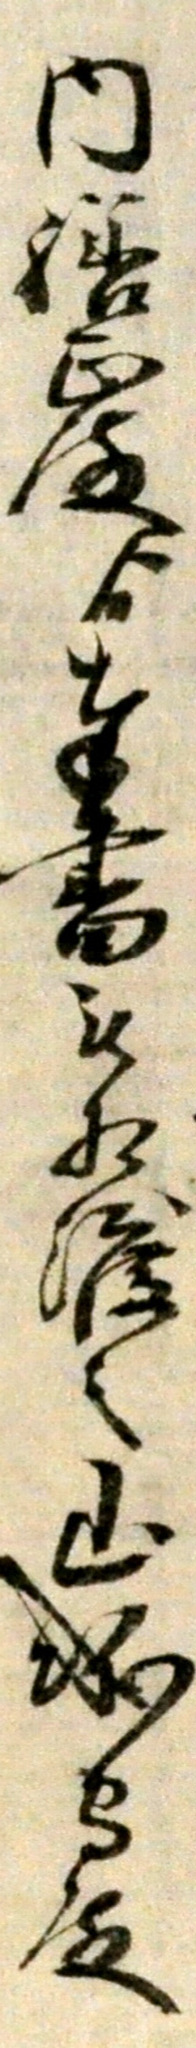内膳正殿ゟ奉書被相渡之山城守殿
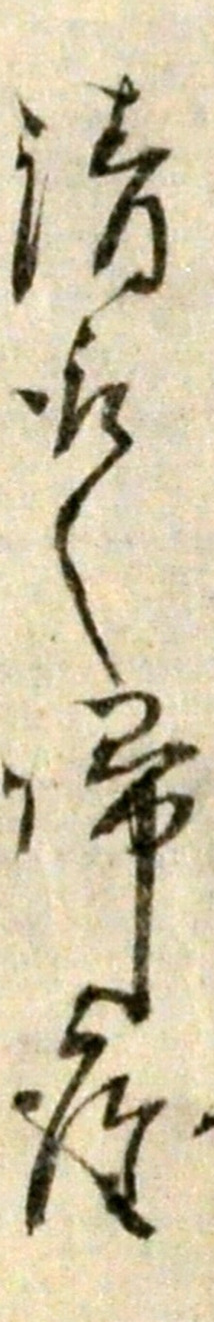請取之帰座
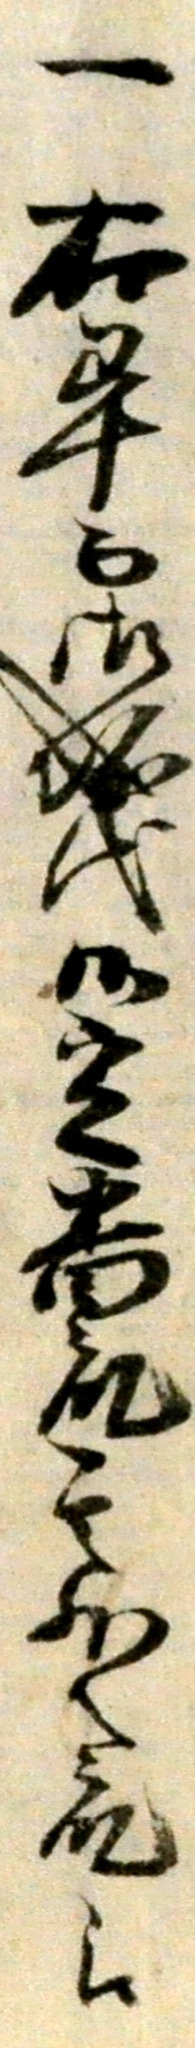一卆而御城代御定番衆其外之衆江
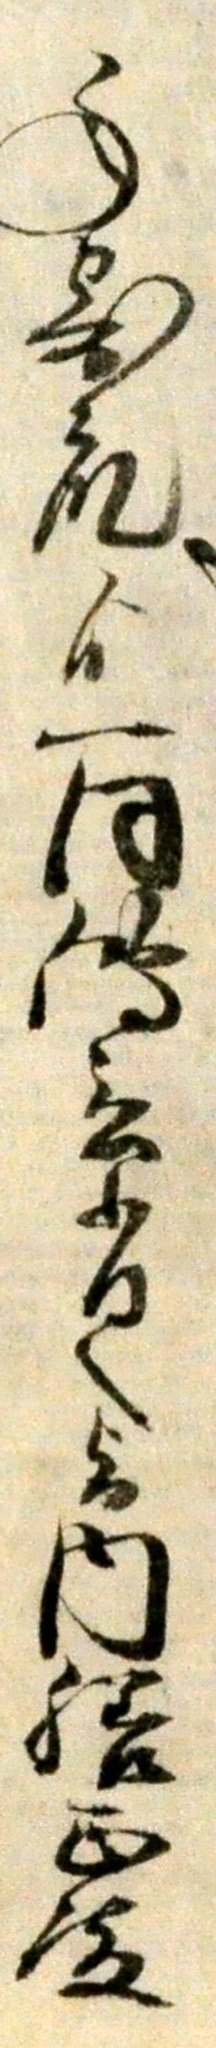年寄衆ゟ一同伝言有之旨内膳正殿
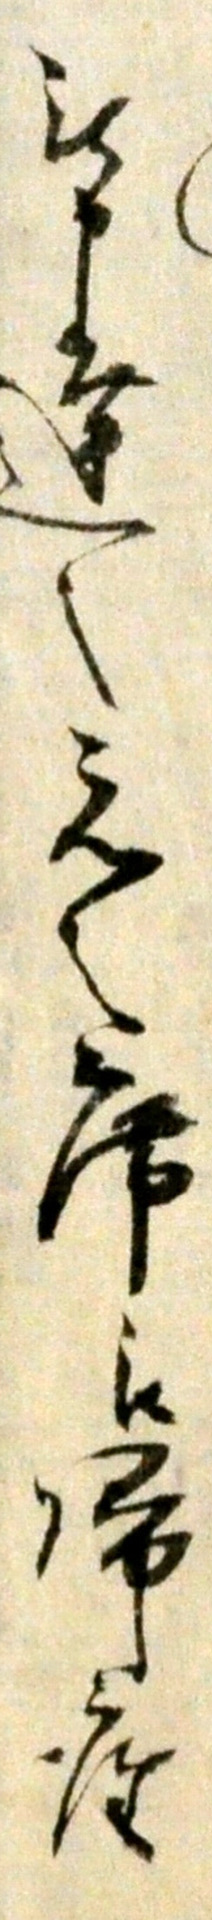被申達之元之席江帰座
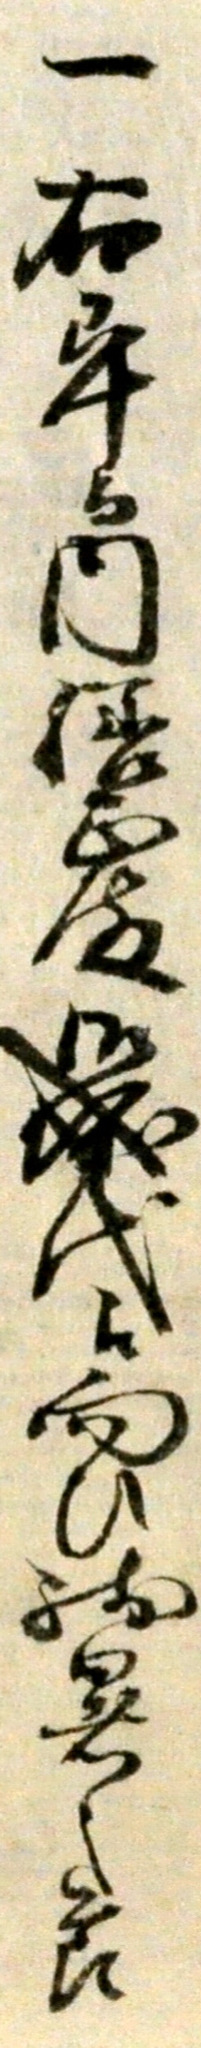一右卆而内膳正殿御城代江向残暑之節
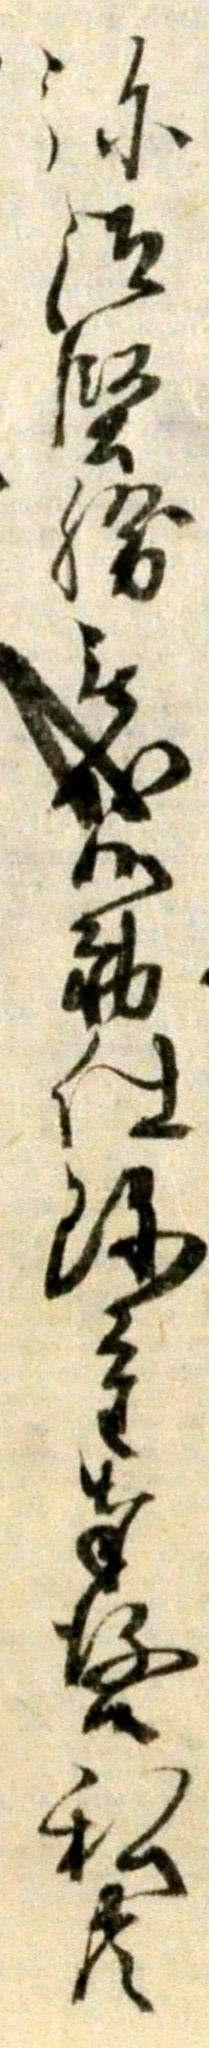弥御賢勝被成御勤仕珍重存候奉存候私共
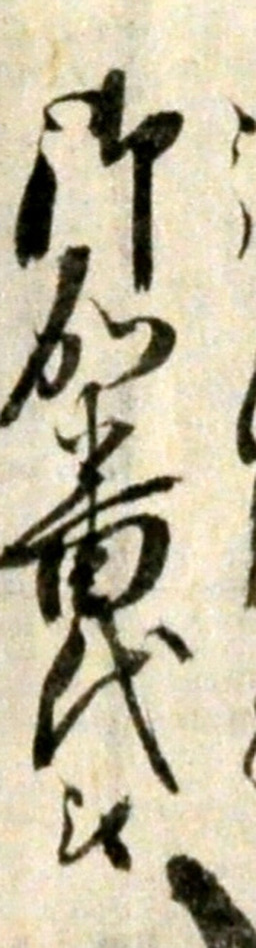御加番代江
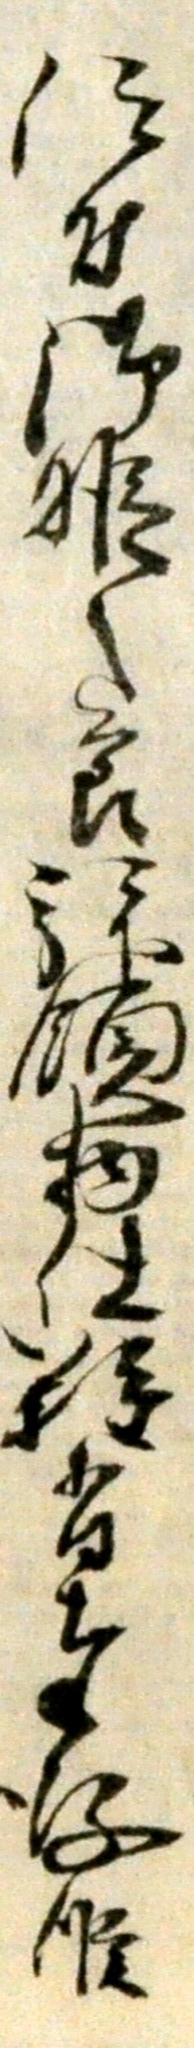仰付御暇之節拝領物仕難有奉存候
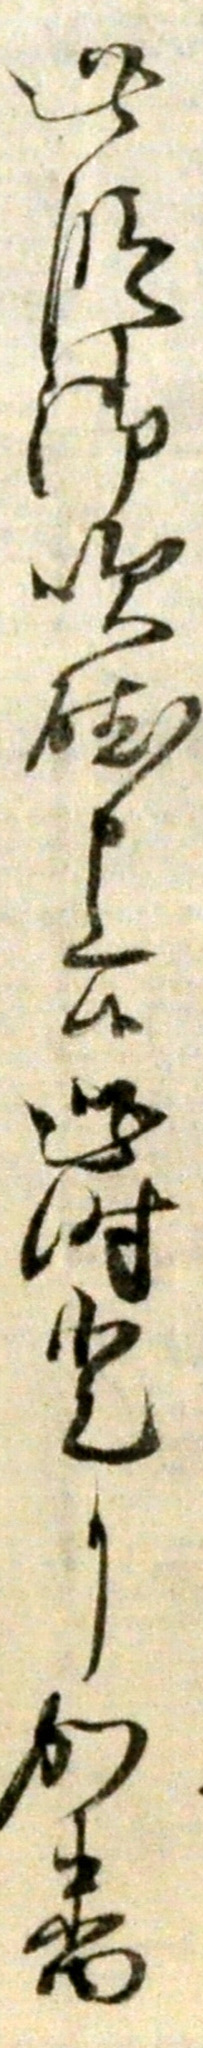此段御吹聴申上候此時登り加番
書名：大阪加番関係諸書留〔一括〕
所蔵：伊那市立高遠町図書館・合同会社AMANE
